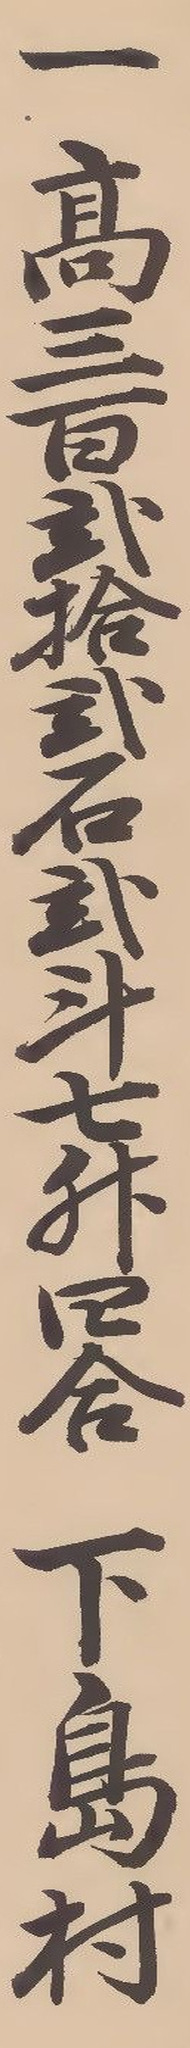一高三百弐拾弐石弐斗七升四合下島村
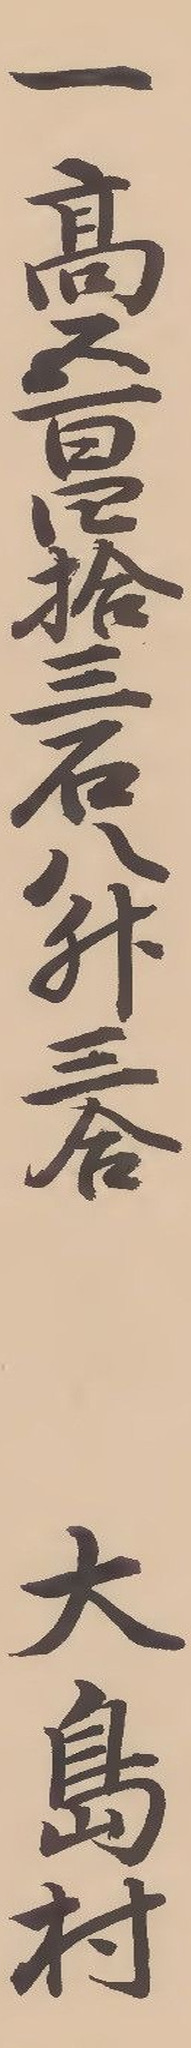一高五百四拾三石八升三合大島村
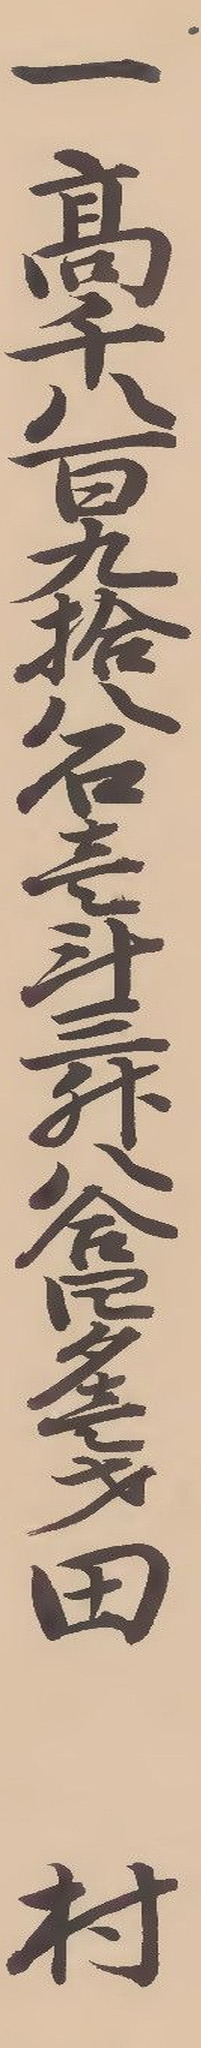一高千八百九拾八石壱斗三升八合四勺壱才田村
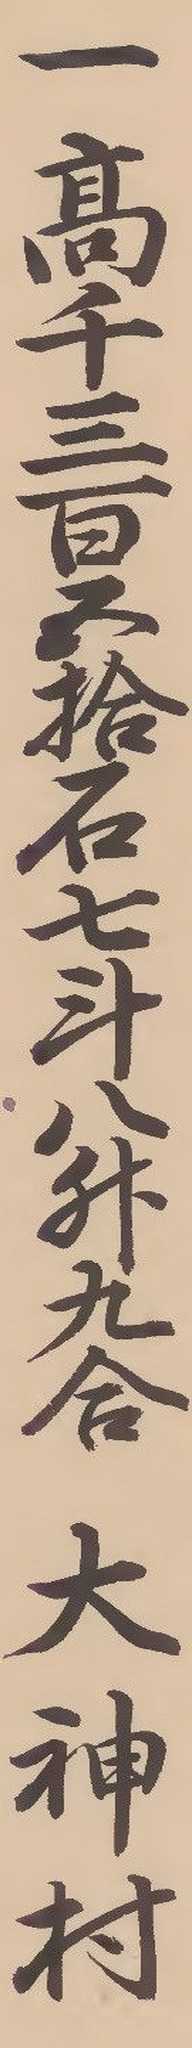一高千三百五拾石七斗八升九合大神村

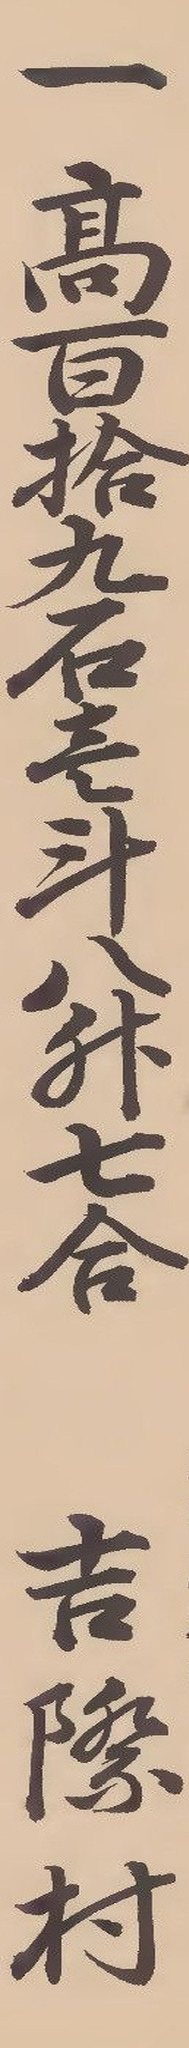一高百拾九石壱斗八升七合吉際村
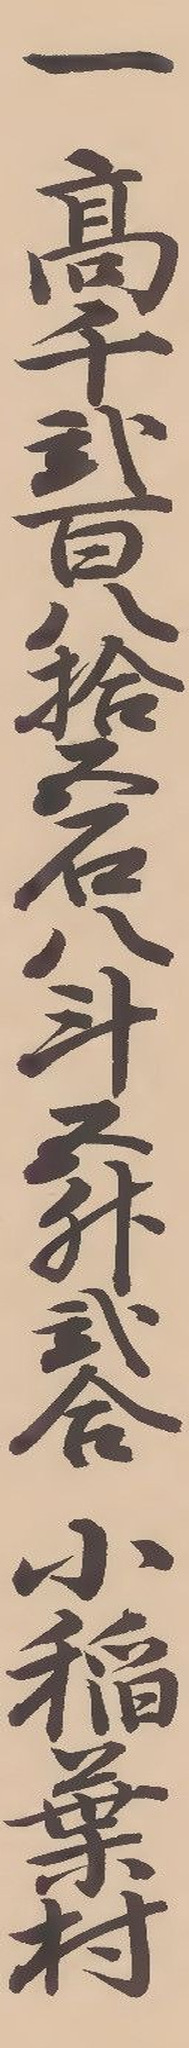一高千弐百八拾五石八斗五升弐合小稲葉村
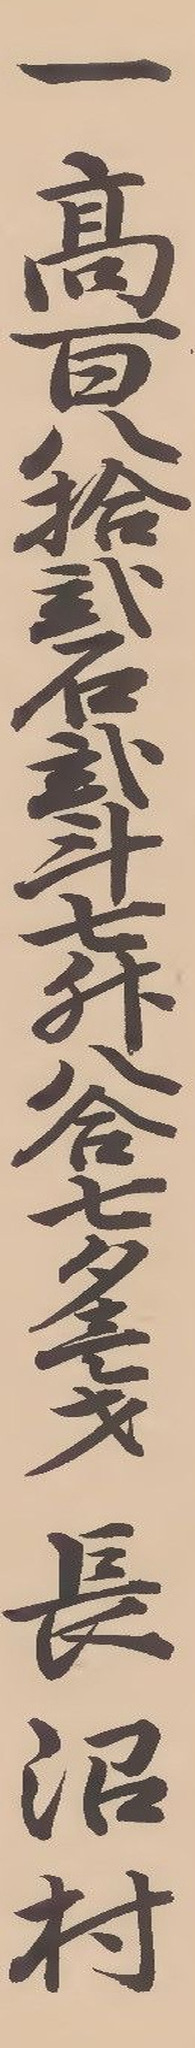一高百八拾弐石弐斗七升八合七夕壱才長沼村
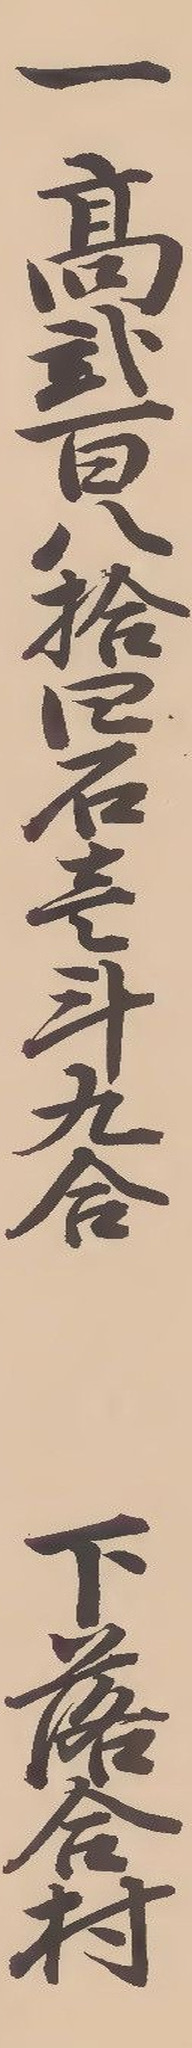一高弐百八拾四石壱斗九合下落合村
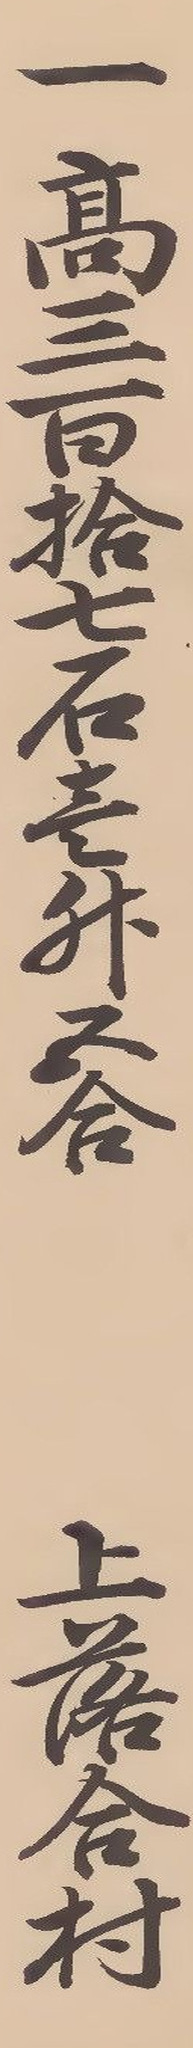一高三百拾七石壱升五合上落合村
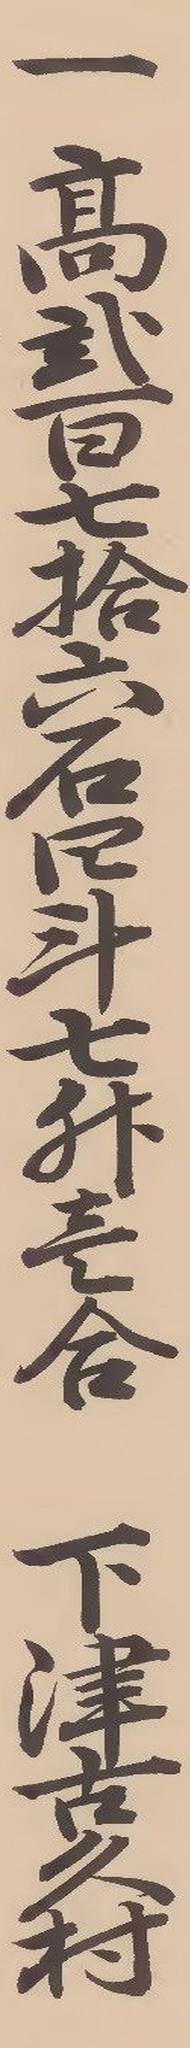一高弐百七拾六石四斗七升壱合下津古久村
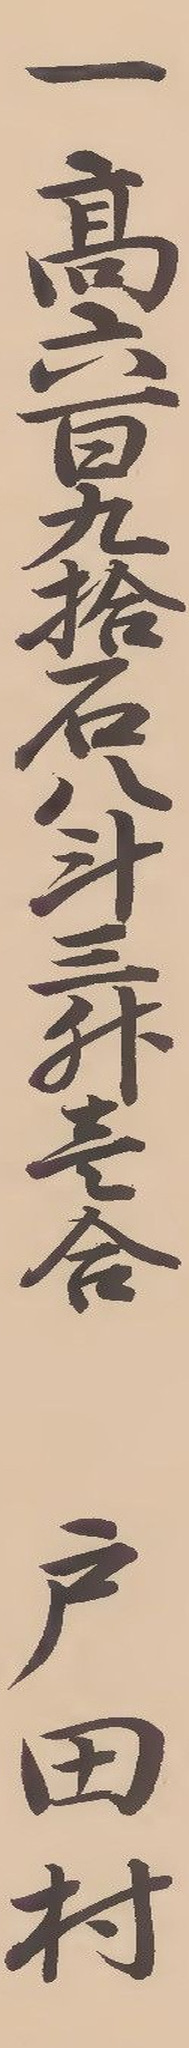一高六百九拾石八斗三升壱合戸田村
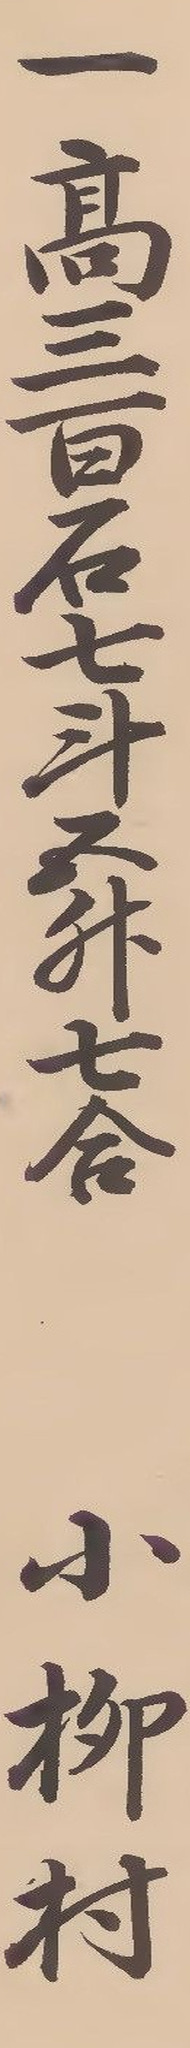一高三百石七斗五升七合小柳村

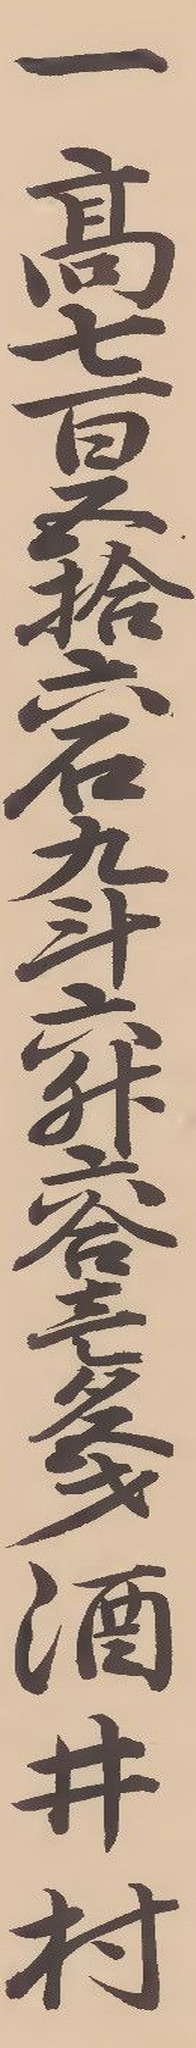一高七百五拾六石九斗六升六合壱勺五才酒井村
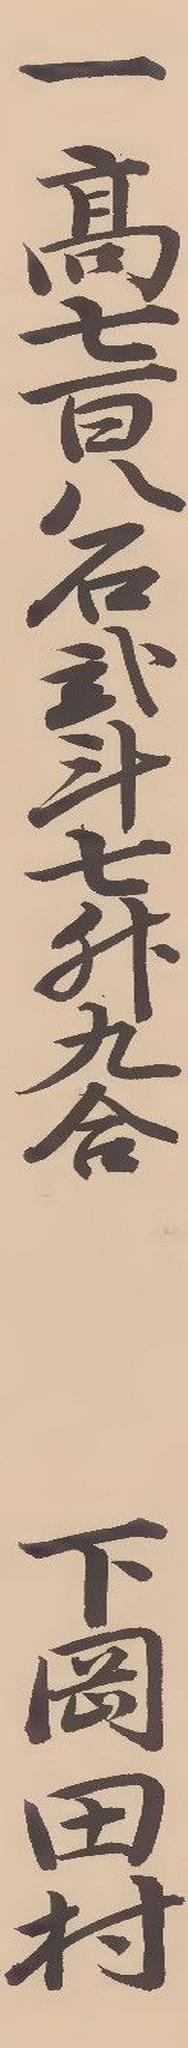一高七百八石弐斗七升九合下岡田村
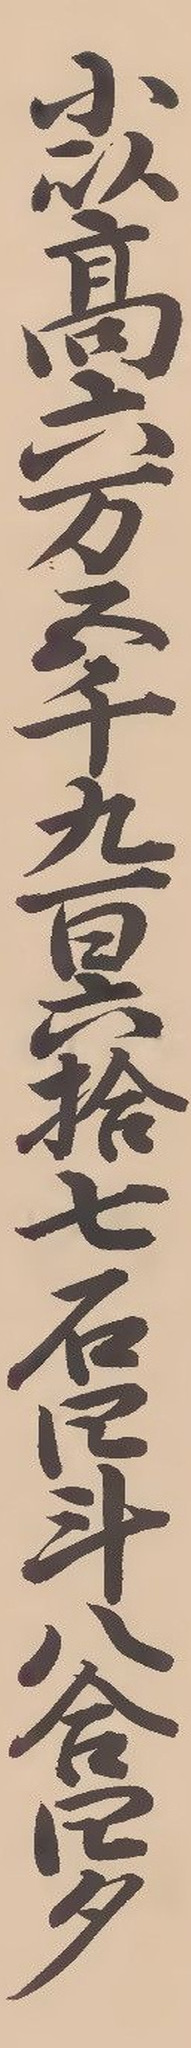小以高六万五千九百六拾七石四斗八合四勺

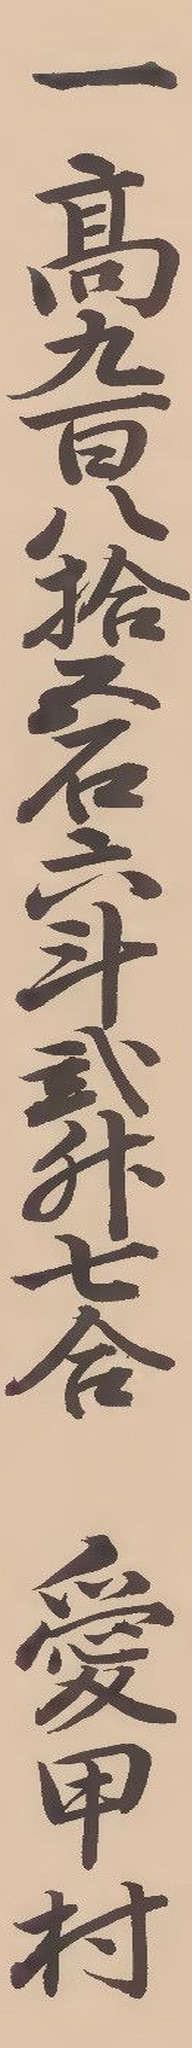一高九百八拾五石六斗弐升七合愛甲村
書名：相模国郷帳
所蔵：国立公文書館 National Archives of Japan
